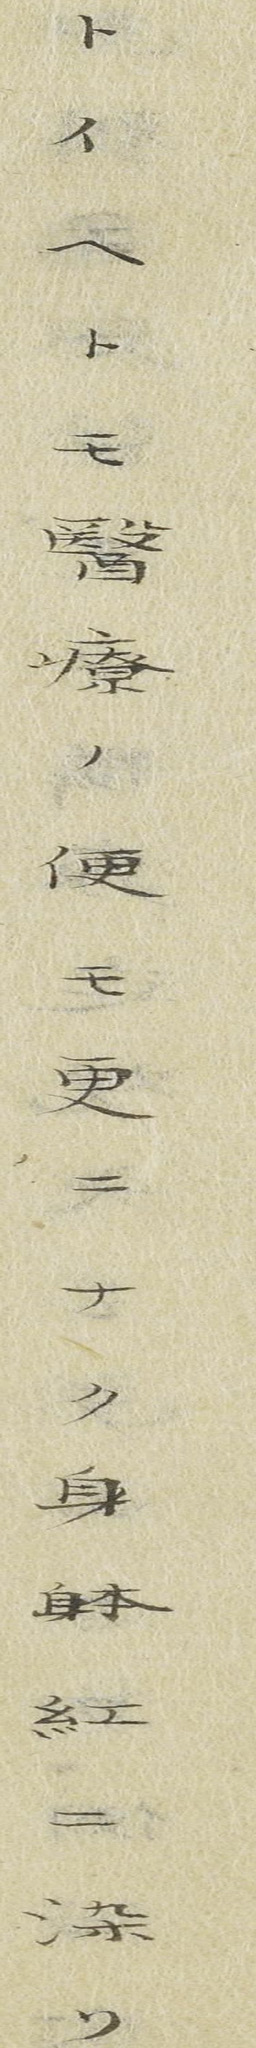トイヘトモ医療ノ便モ更ニナク身体紅ニ染リ
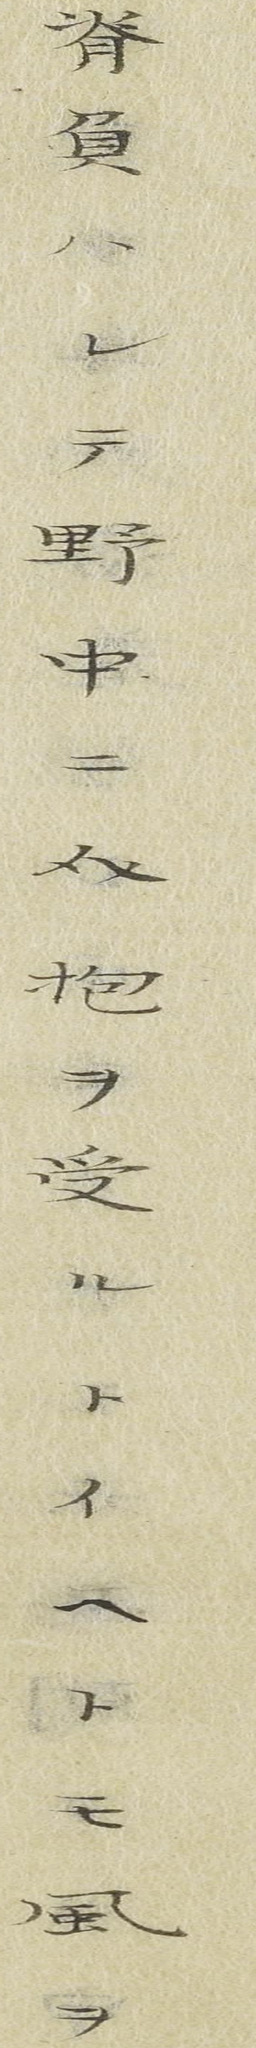背負ハレテ野中ニ介抱ヲ受ルトイヘトモ風ヲ
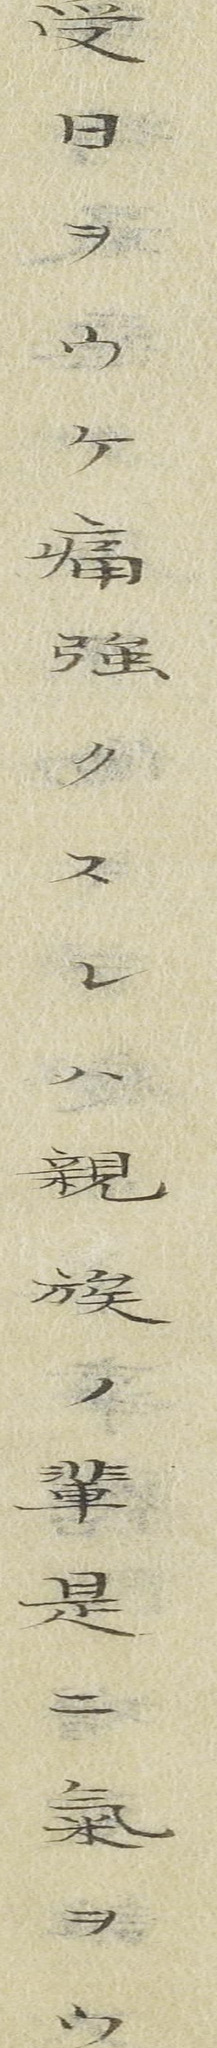受日ヲウケ痛強クスレハ親族ノ輩是ニ気ヲウ
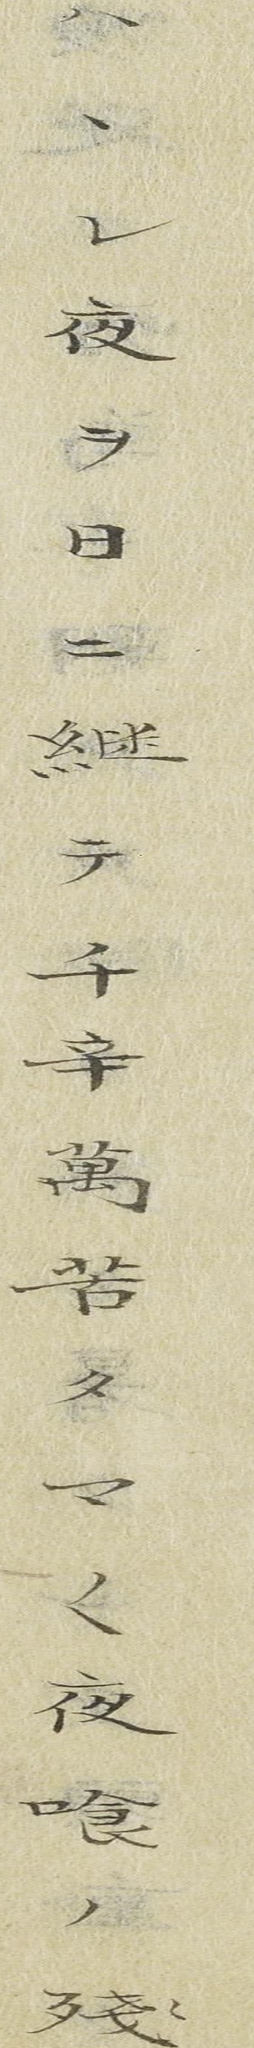ハヽレ夜ヲ日ニ継テ千辛万苦タマ〱夜喰ノ残
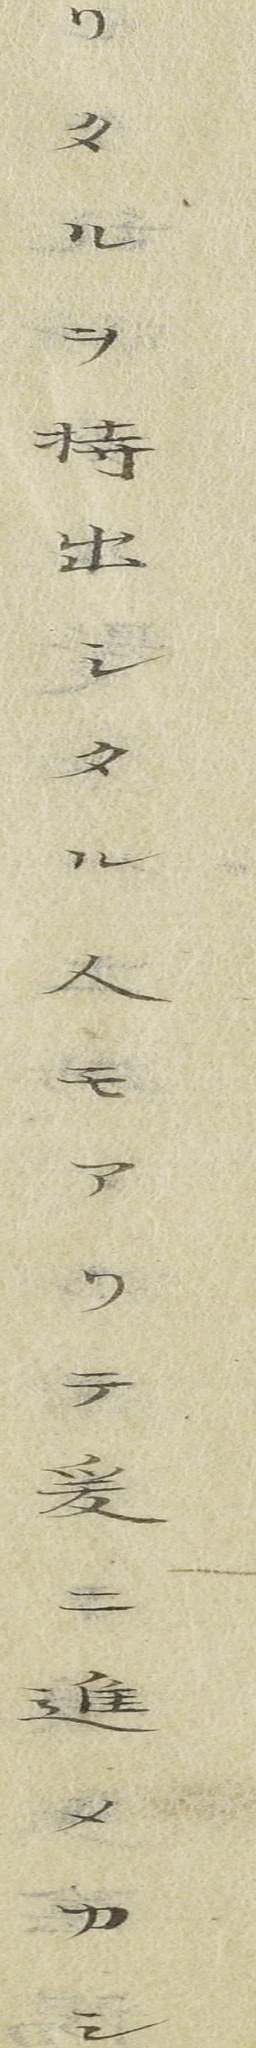リタルヲ持出シタル人モアリテ爰ニ進メカシ
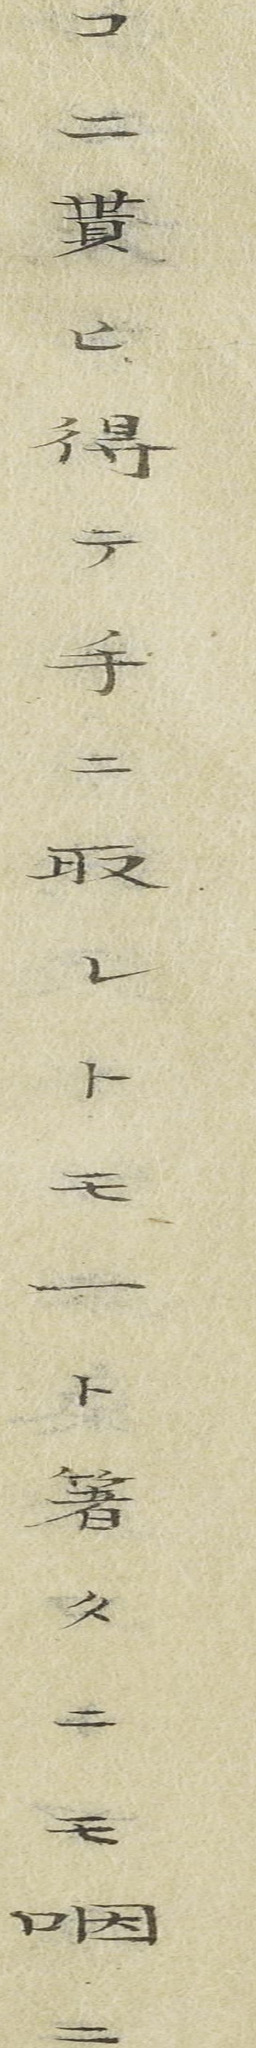コニ貰ヒ得テ手ニ取レトモ一ト箸タニモ咽ニ
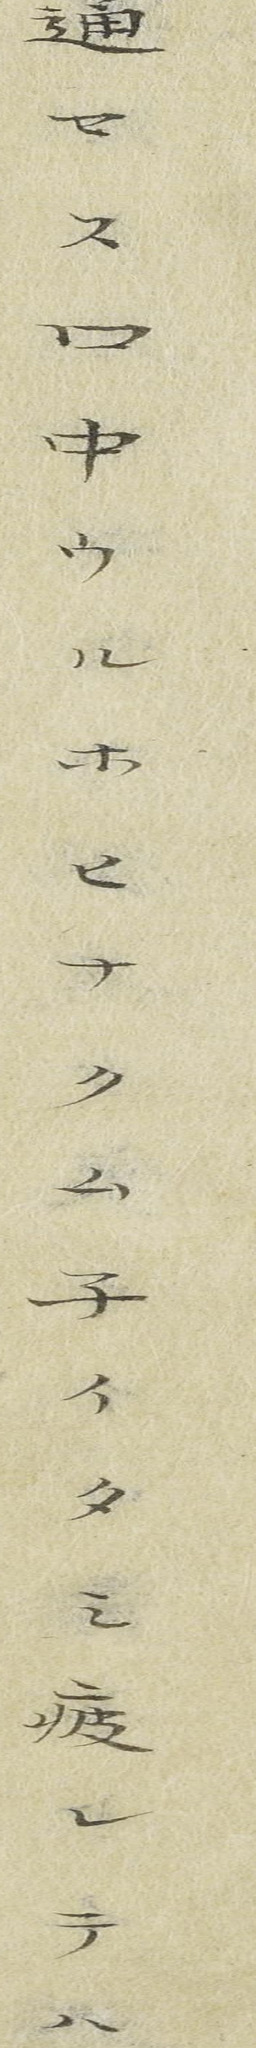通セス口中ウルホヒナクム子イタミ疲レテハ
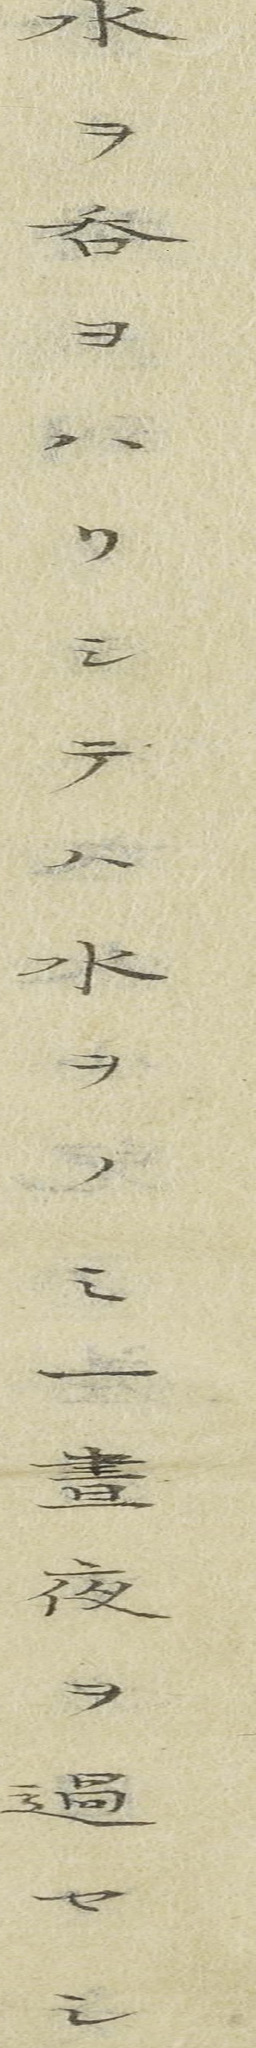水ヲ呑ヨハリシテハ水ヲノミ一昼夜ヲ過セシ

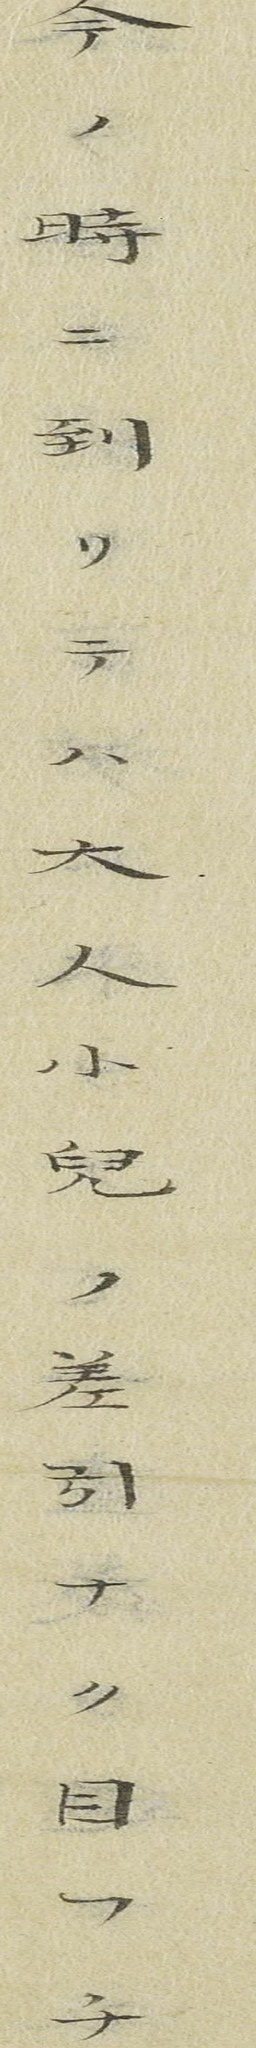今ノ時ニ到リテハ大人小児ノ差別ナク目フチ
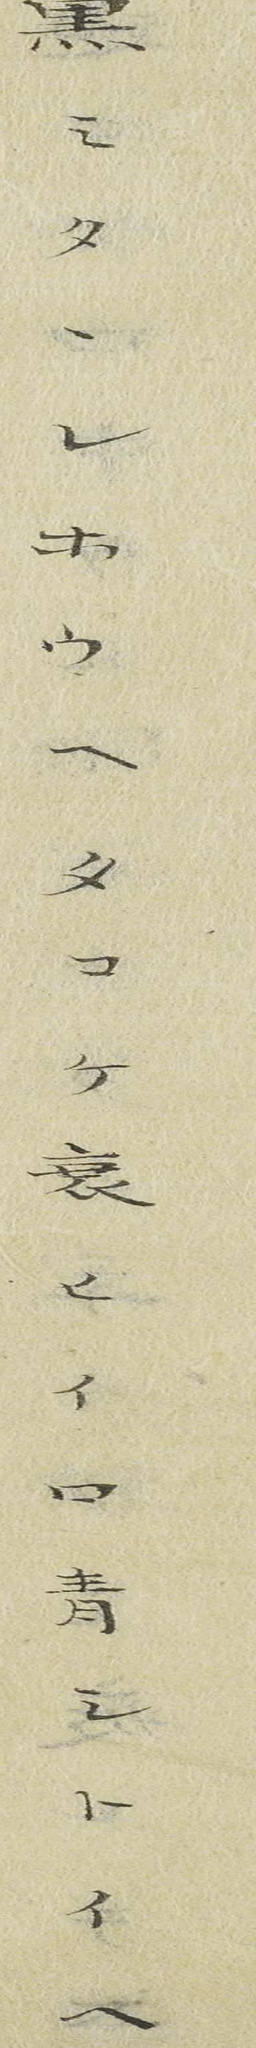黒ミタヽレホウヘタコケ衰ヒイロ青シトイヘ
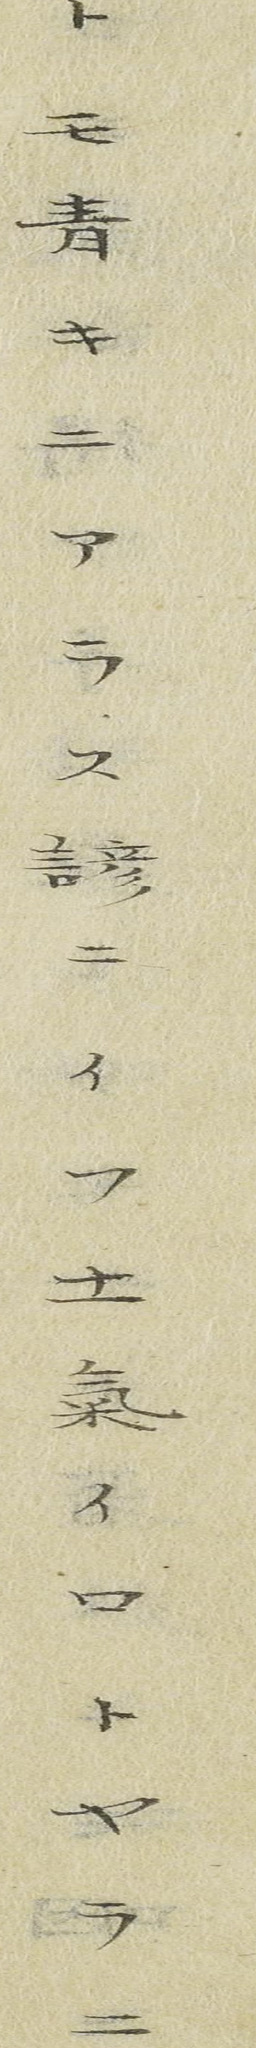トモ青キニアラス諺ニイフ土気イロトヤラニ
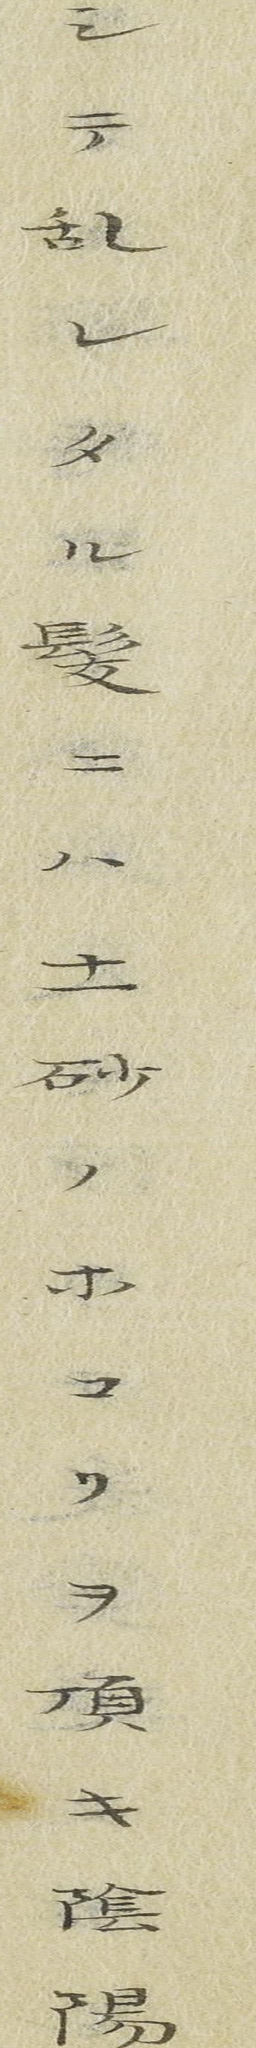シテ乱レタル髪ニハ土砂ノホコリヲ頂キ陰陽
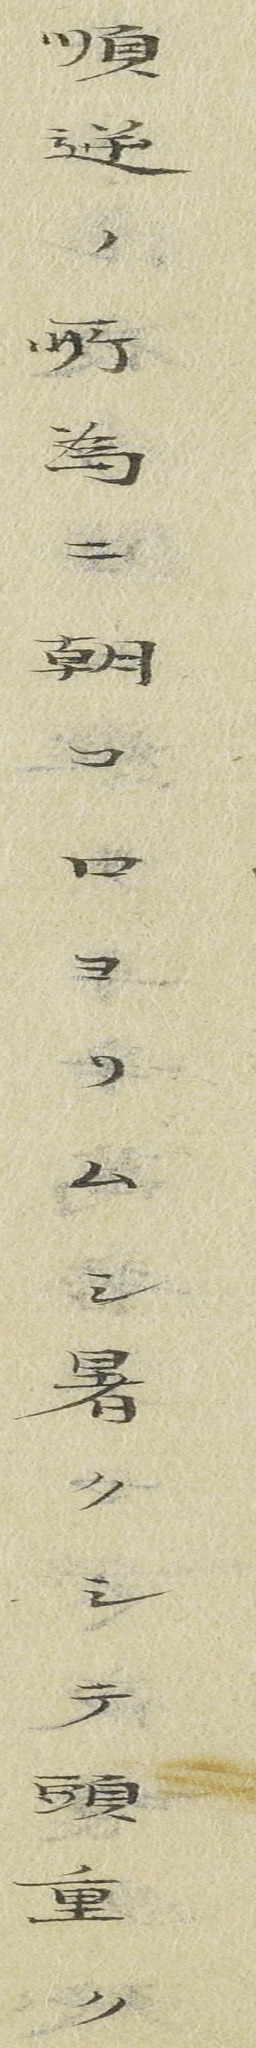順逆ノ所為ニ朝コロヨリムシ暑クシテ頭重ク
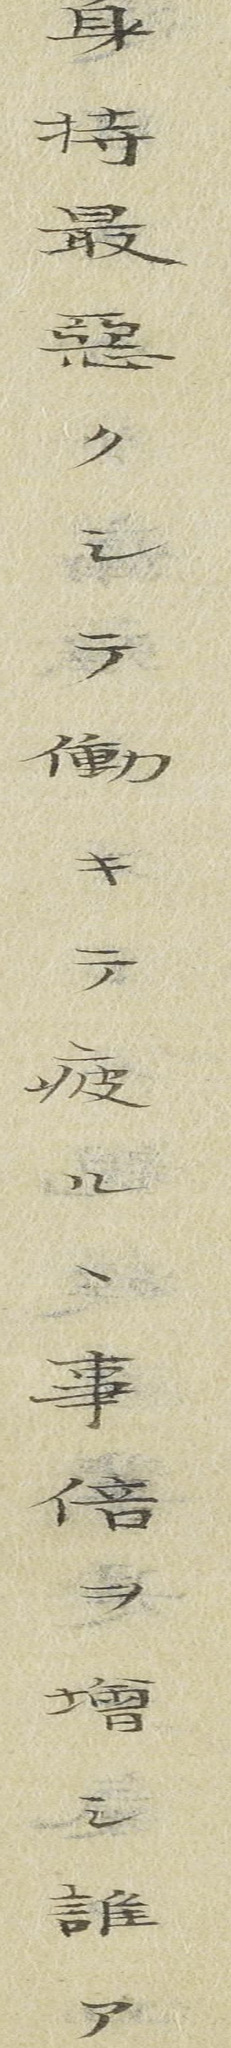身持最悪クシテ働キテ疲ルヽ事倍ヲ増シ誰ア
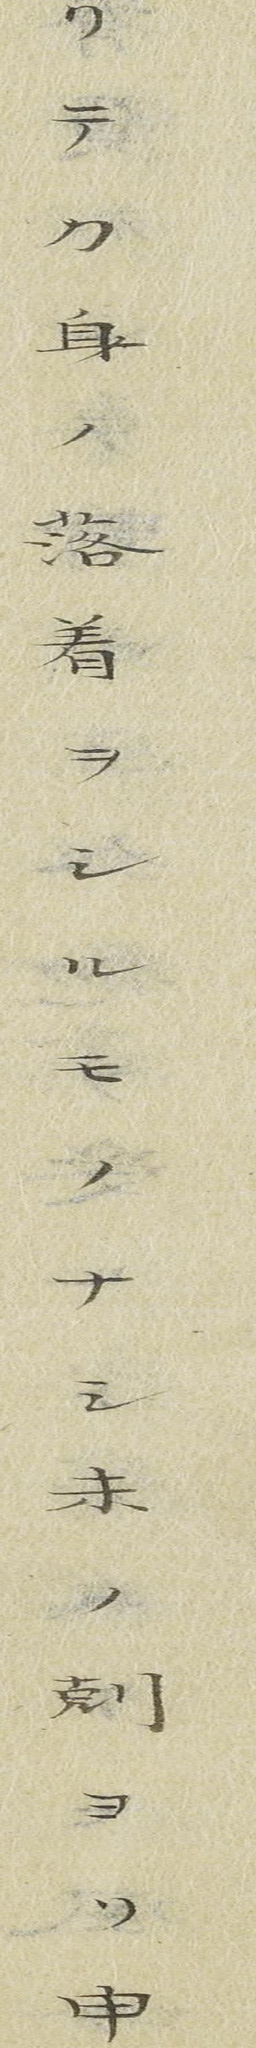リテカ身ノ落着ヲシルモノナシ未ノ剋ヨリ申
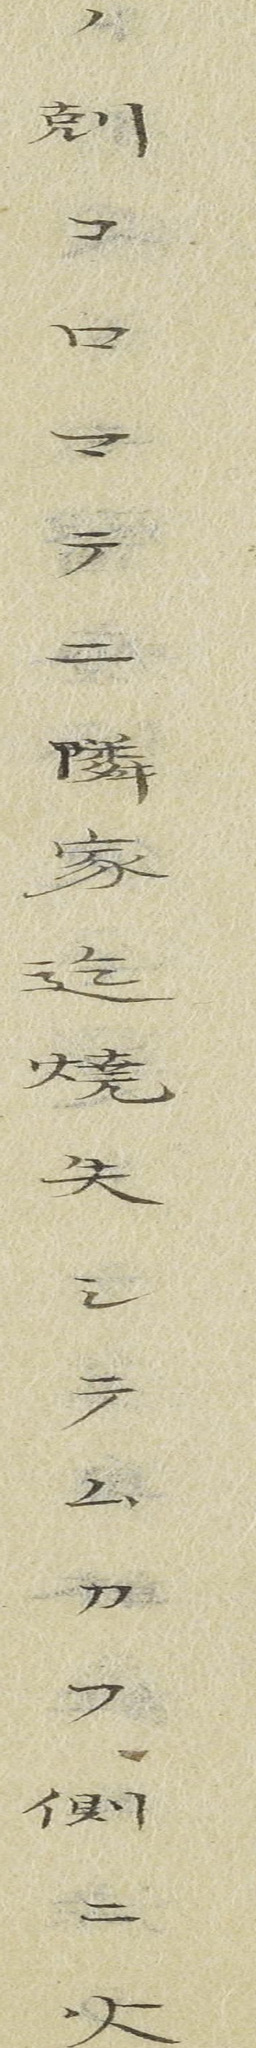ノ剋コロマテニ隣家迄焼失シテムカフ側ニ火
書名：地災撮要　地震之部　巻ノ二
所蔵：東京大学地震研究所図書室 Earthquake Research Institute Library, The University of Tokyo, JAPAN
